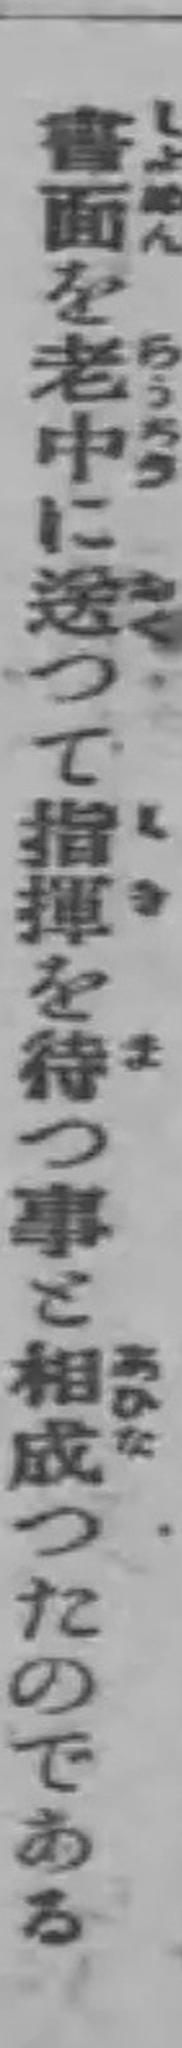書面を老中に送つて指揮を待つ事と相成つたのである
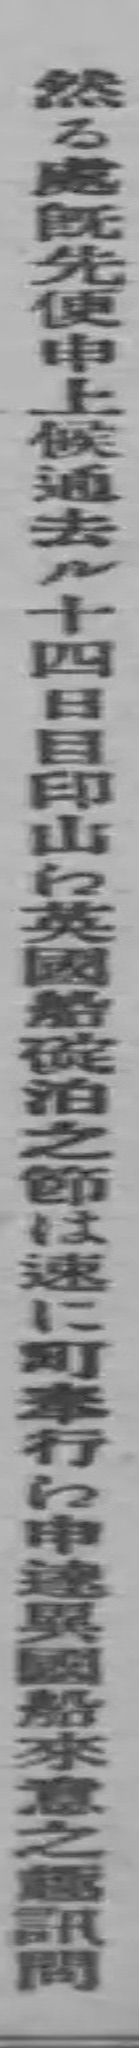然る処既先便申上候通去ル十四日目印山え英国船碇泊之節は速に町奉行え申達異国船来意之趣訊問
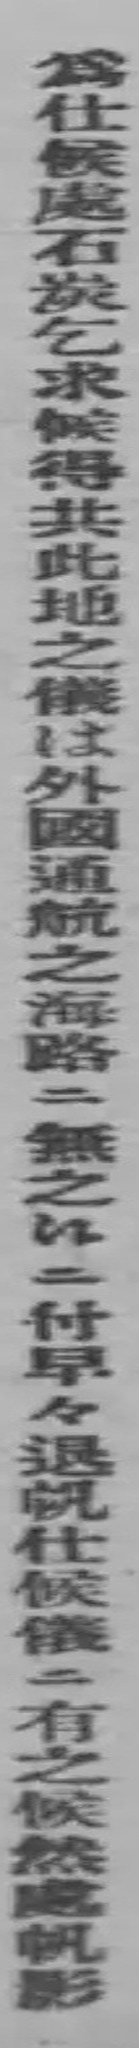為仕候処石炭乞求候得共此地之儀は外国通航之海路ニ無之候ニ付早々退帆仕候儀ニ有之候然処帆影
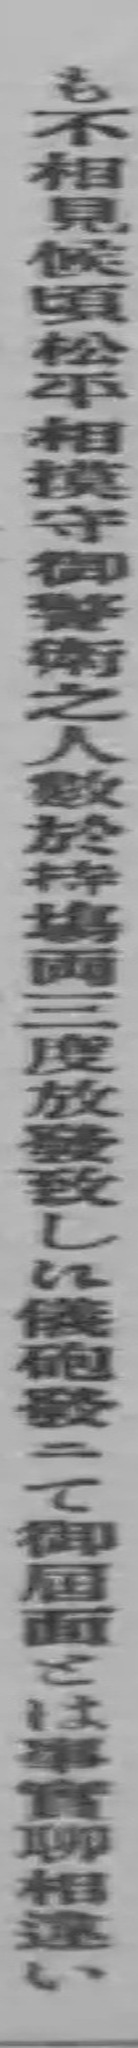も不相見候頃松平相摸守御警衛之人数於持場両三度放発致し候儀砲発ニて御届面とは事実聊相違い
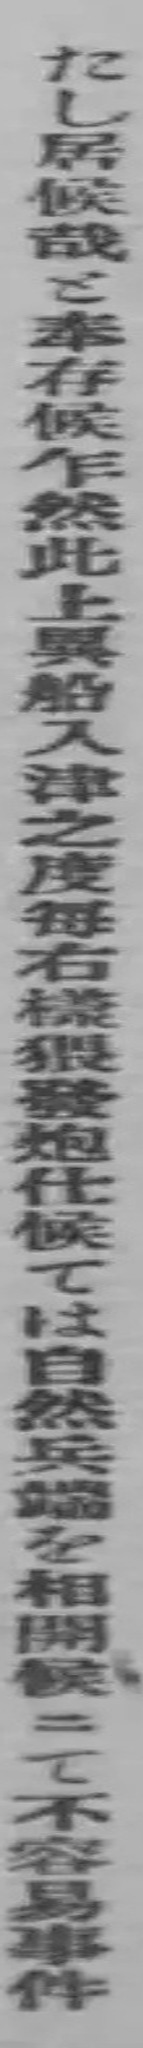たし居候哉と奉存候乍然此上異船入津之度毎右様猥発炮仕候ては自然兵端を相開候ニて不容易事件
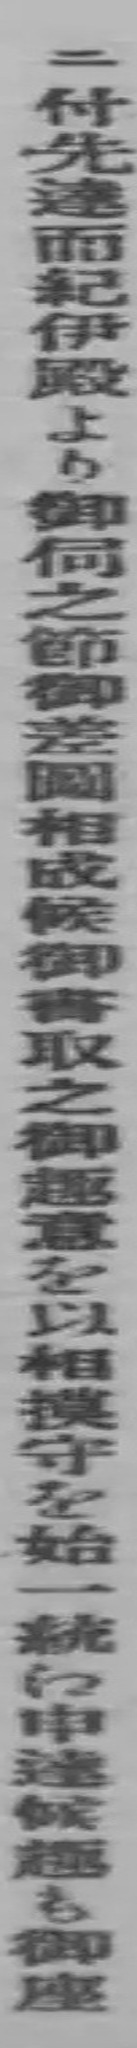ニ付先達而紀伊殿より御伺之節御差図相成候御書取之御趣意を以相摸守を始一統え申達候趣も御座
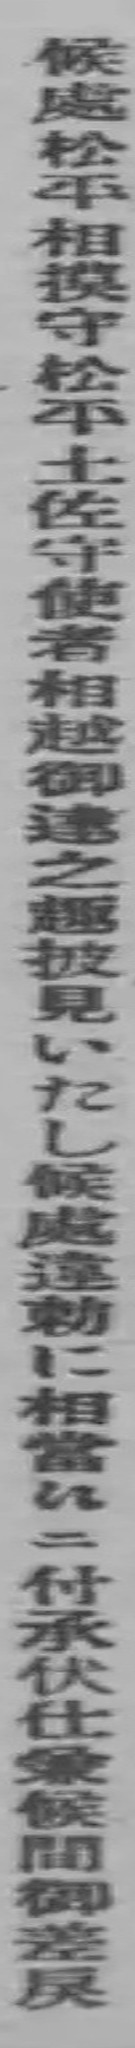候処松平相摸守松平土佐守使者相越御達之趣披見いたし候処違勅に相当候ニ付承伏仕兼候間御差戻
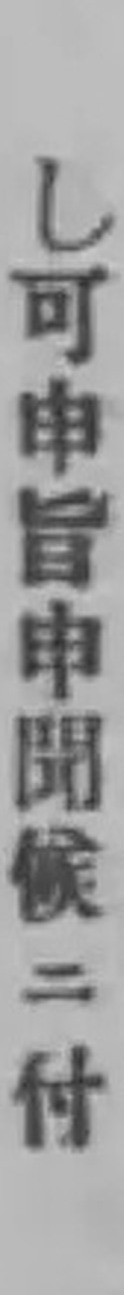し可申旨申聞候ニ付
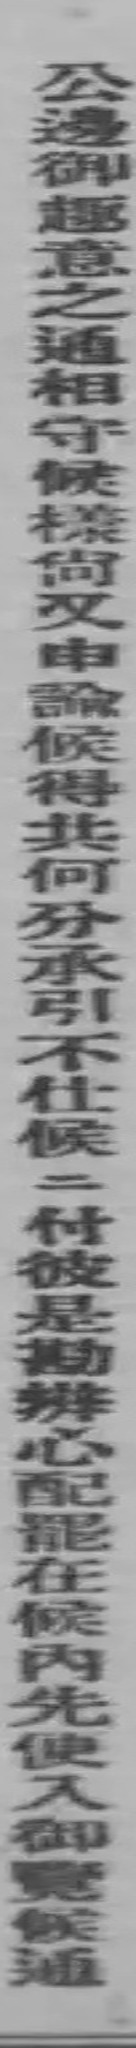公辺御趣意之通相守候様尚又申諭候得共何分承引不仕候ニ付彼是勘弁心配罷在候内先便入御覧候通
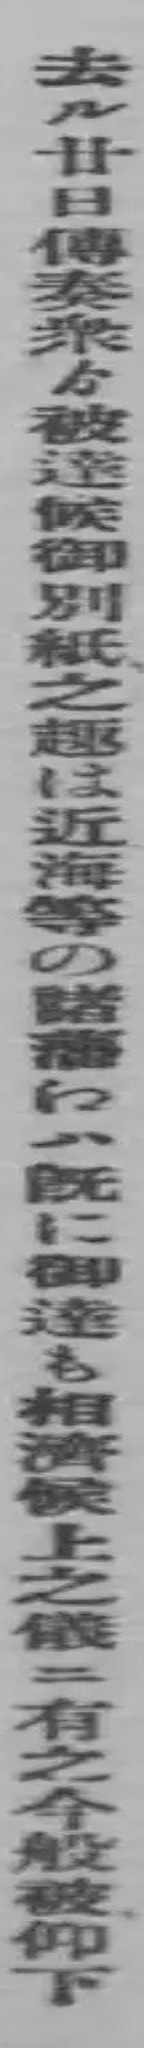去ル廿日伝奏衆ゟ被達候御別紙之趣は近海等の緒藩えハ既に御達も相済候上之儀ニ有之今般被仰下
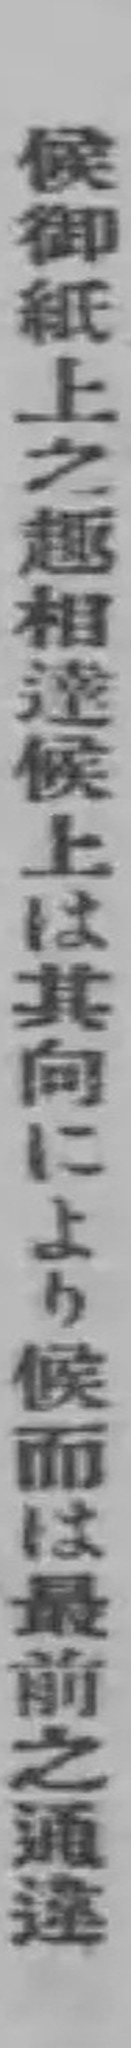候御紙上之趣相達候上は其向により候而は最前之通達
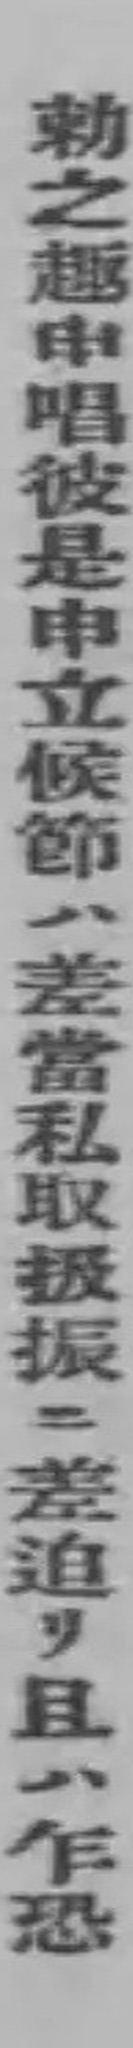勅之趣申唱彼是申立候節は差当私取扱振ニ差迫リ且ハ乍恐
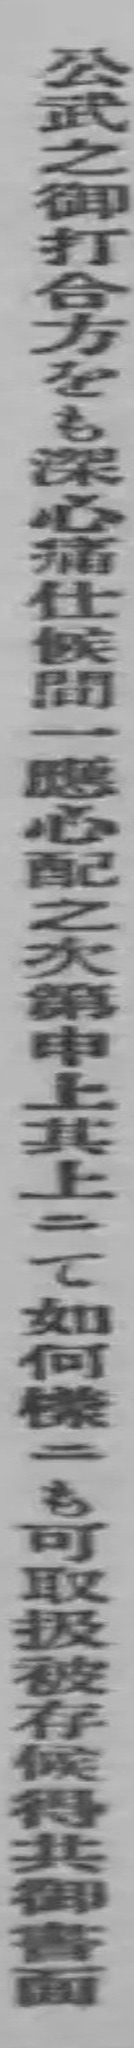公武之御打合方をも深心痛仕候間一応心配之次第申上其上ニて如何様ニも可取扱被存候得共御書面
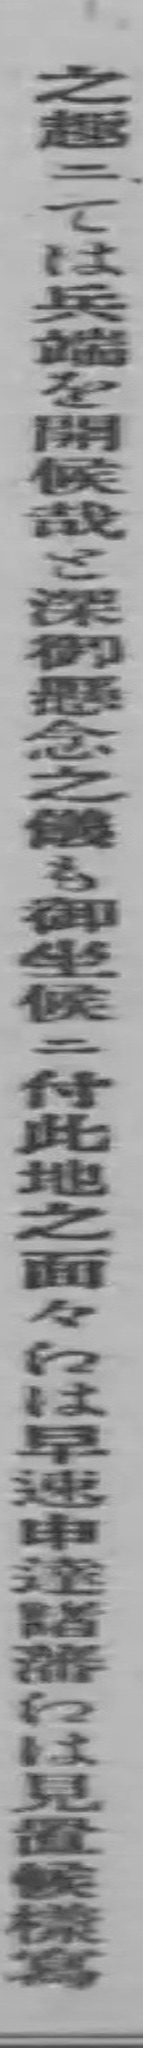之趣ニては兵端を開候哉と深御懸念之儀も御坐候ニ付此地之面々えは早速申達緒藩えは見置候様写
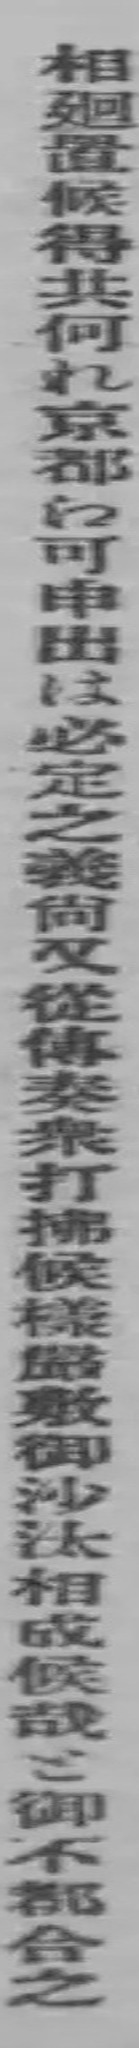相廻置候得共何れ京都え可申出は必定之義尚又従伝奏衆打払候様厳敷御沙汰相成候哉と御不都合之
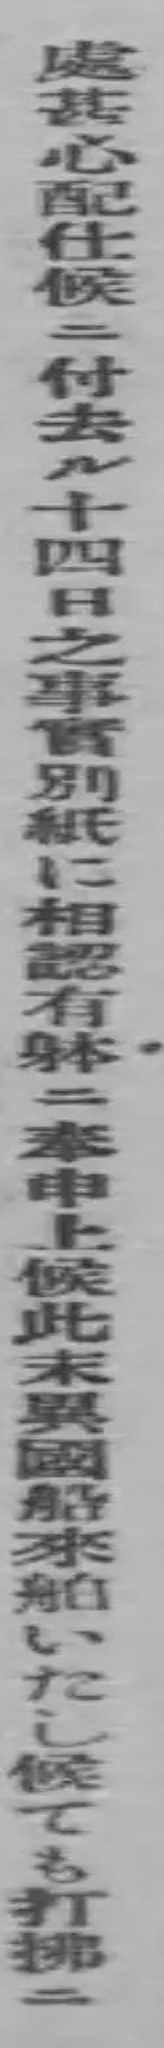処甚心配仕候ニ付去ル十四日之事実別紙に相認有躰ニ奉申上候此末異国船来舶いたし候ても打払ニ
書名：豊橋市史談
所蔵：国立国会図書館 National Diet Library, JAPAN
